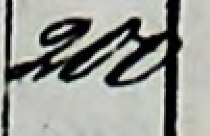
200
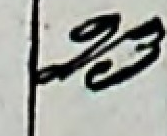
23
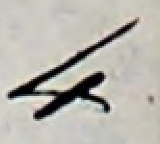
4
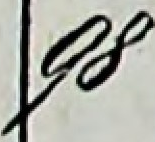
98
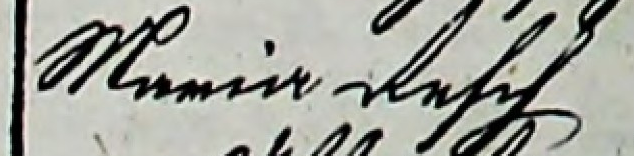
Maria Resch
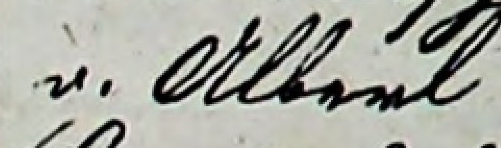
v. Alberl
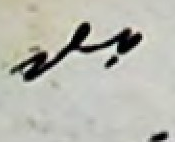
do
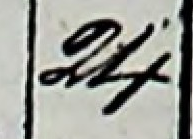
24
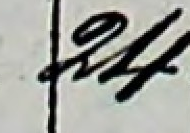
24
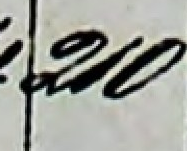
210
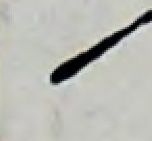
1
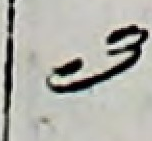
3
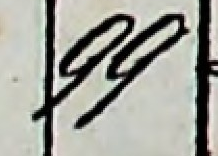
99
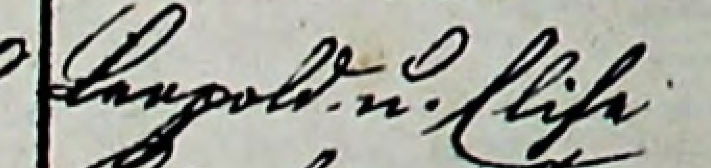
Leopold u. Elise
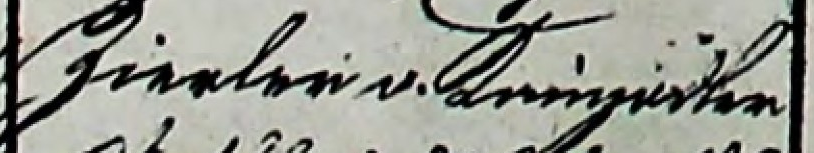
Zierler v. Kainzodler
